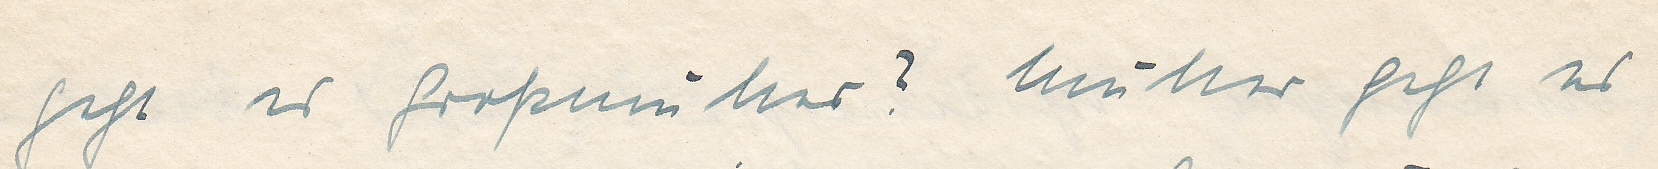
geht es Großmutter? Mutter geht es
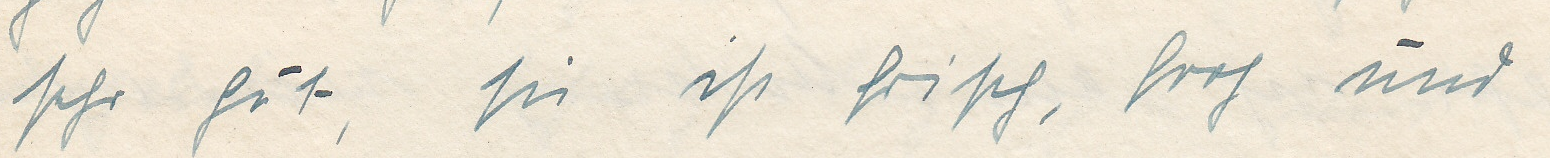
sehr gut, sie ist frisch froh und
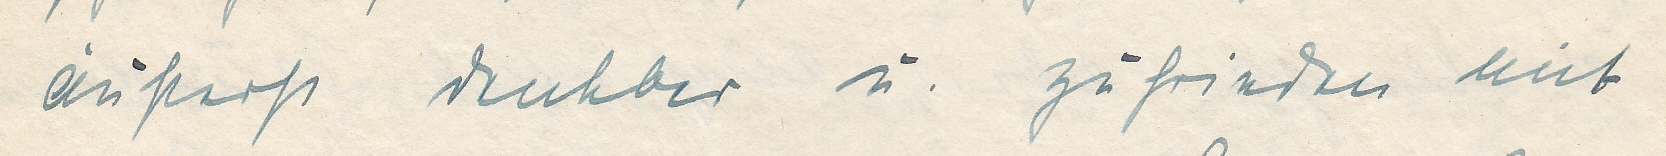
äußerst dankbar u. zufrieden mit
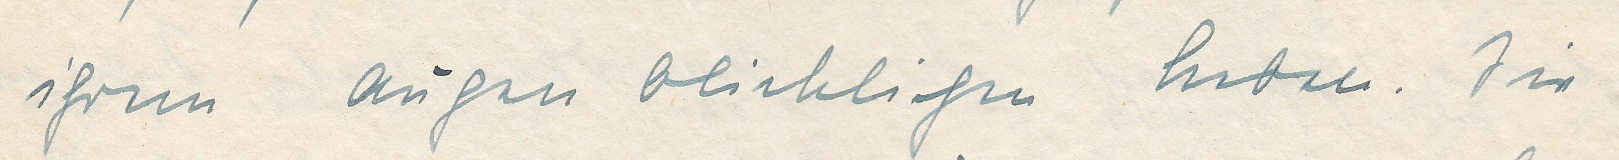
ihrem augenblicklichen Leben Sie
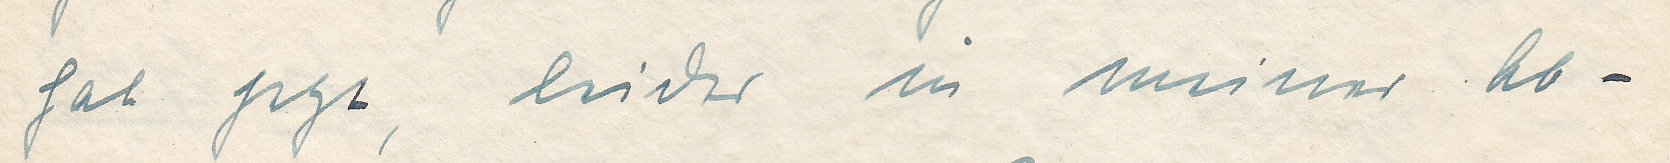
hat jetzt, leider in meiner Ab-
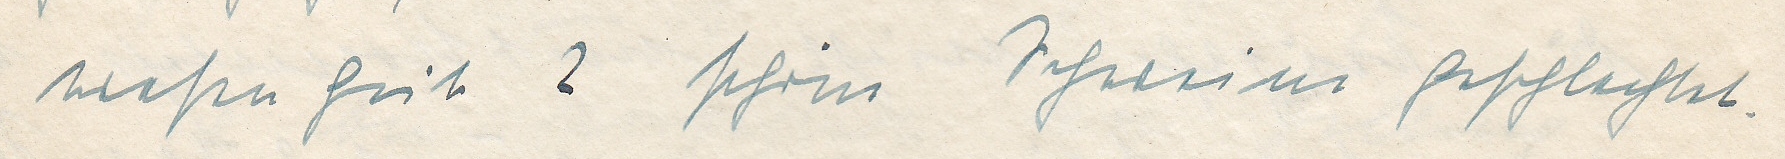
wesenheit 2 schöne Schweine geschlachtet.
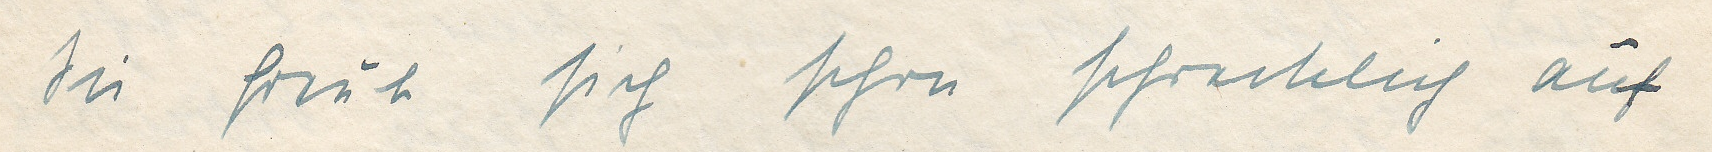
Sie freut sich schon schrecklich auf
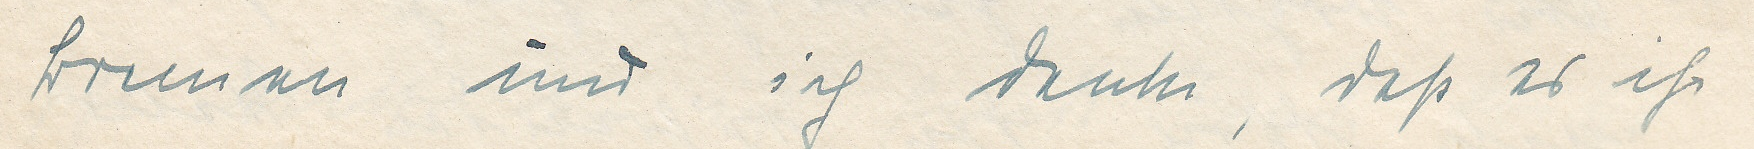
Bremen und ich denke, daß es ihr
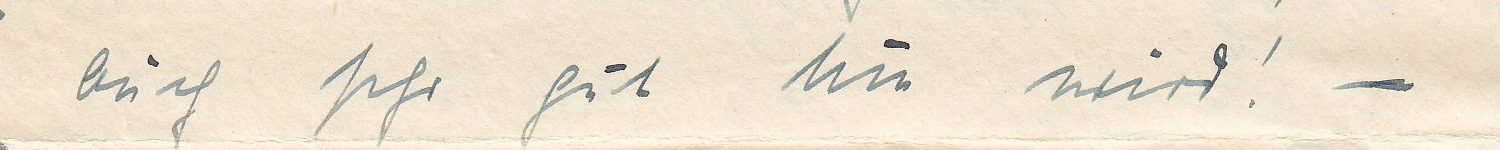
auch sehr gut tun wird! -
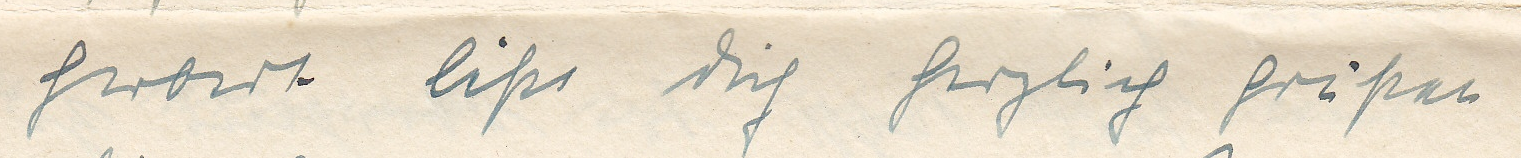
Herbert läßt Dich herzlich grüßen
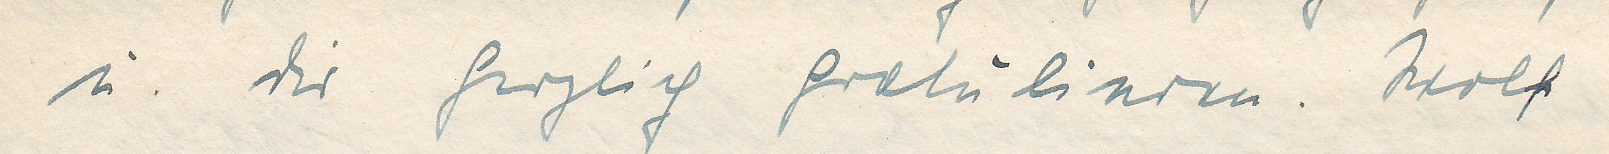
u. Dir herzlich gratulieren. Wolf
